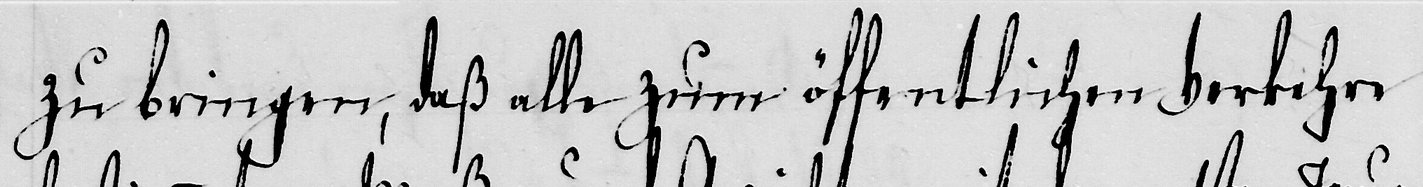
zu bringen, daß alle zum öffentlichen Verkehre
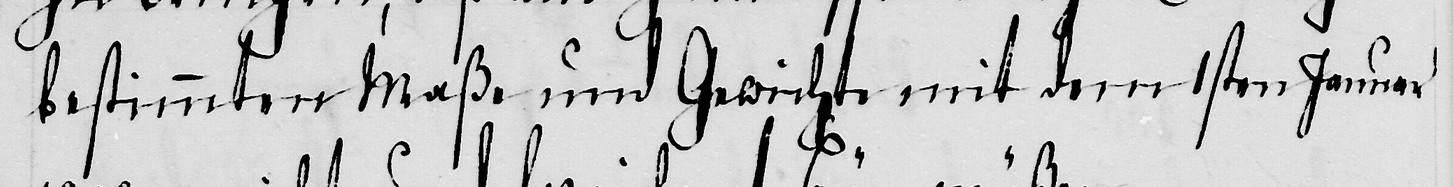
bestimmten Maße und Gewichte mit dem 1sten Januar
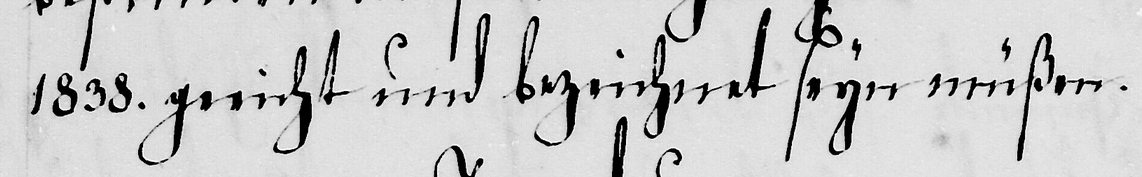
1838. geeicht und bezeichnet seyn müßen.
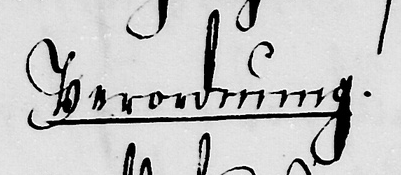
Verordnung.
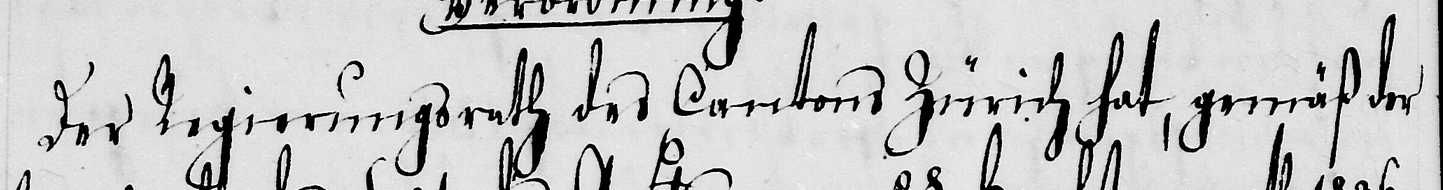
Der Regierungsrath des Cantons Zürich hat, gemäß der
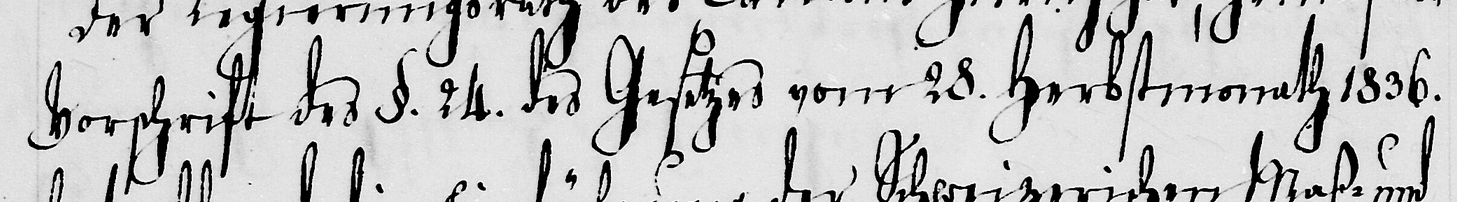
Vorschrift des §. 24. des Gesetzes vom 28. Herbstmonath 1836.
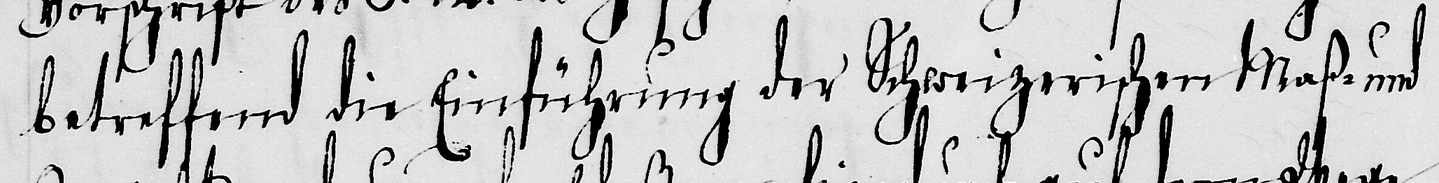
betreffend die Einführung der Schweizerischen Maß- und
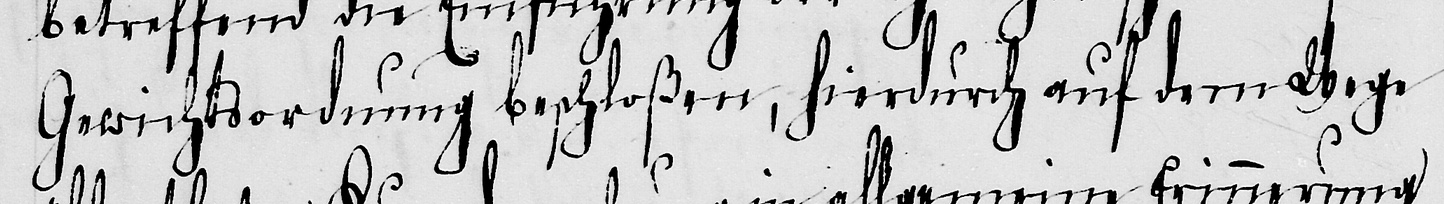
Gewichtsordnung beschloßen, hierdurch auf dem Wege
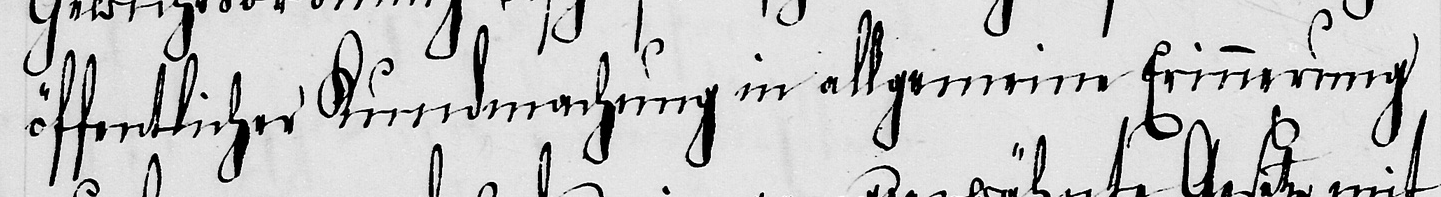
öffentlicher Kundmachung in allgemeine Erinnerung
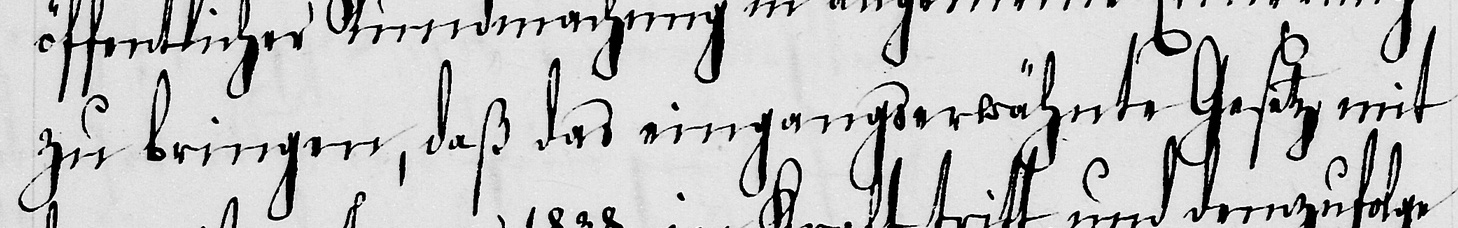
zu bringen, daß das eingangserwähnte Gesetz mit
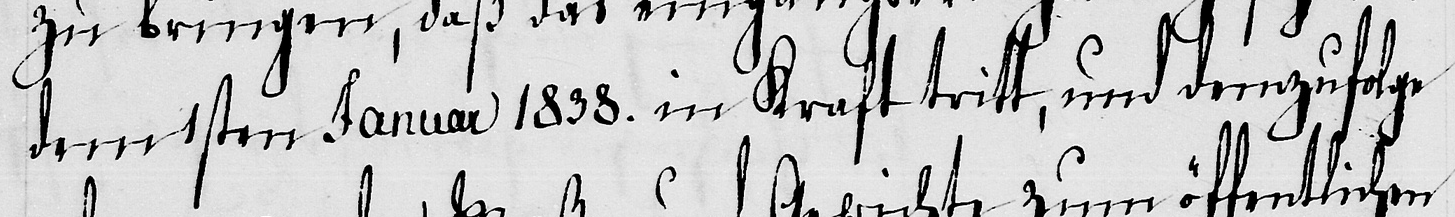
dem 1sten Januar 1838. in Kraft tritt, und demzufolge
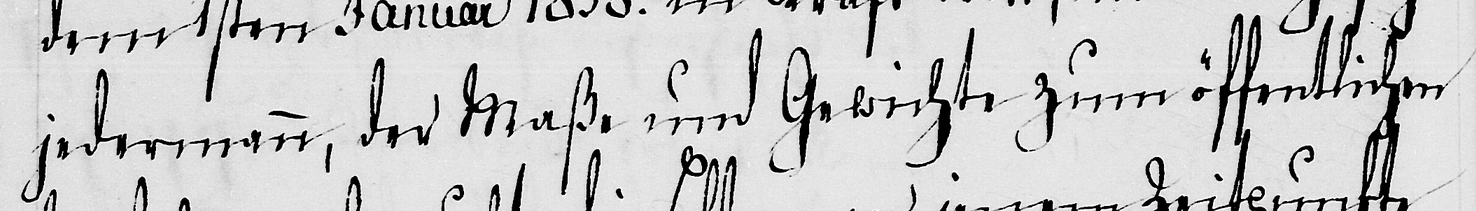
jedermann, der Maße und Gewichte zum öffentlichen
